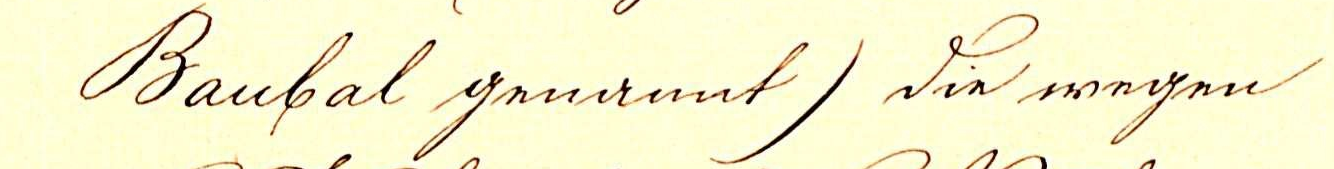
Baubal genannt) die wegen
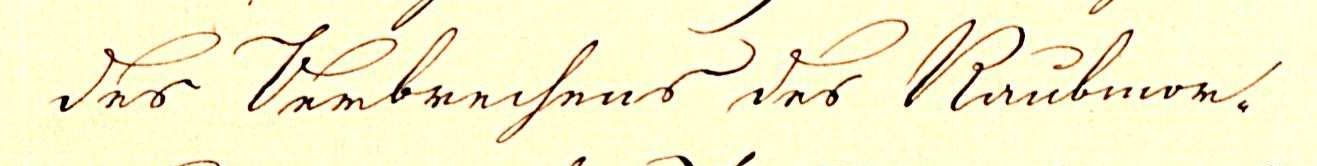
des Verbrechens des Raubmor¬
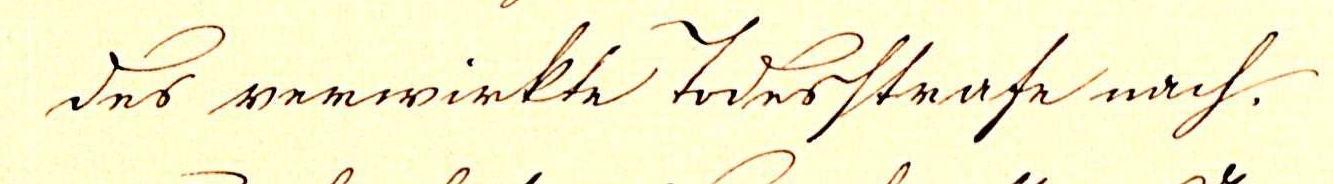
des verwirkte Todesstrafe nach
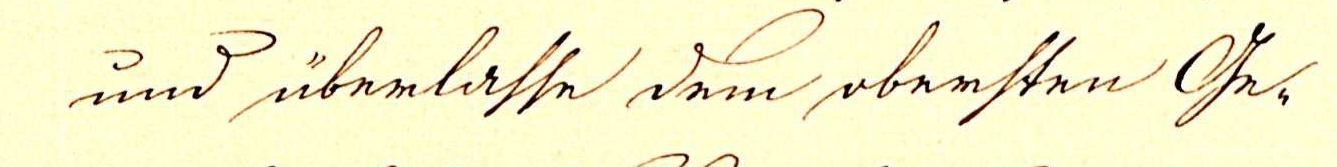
und überlasse dem obersten Ge¬
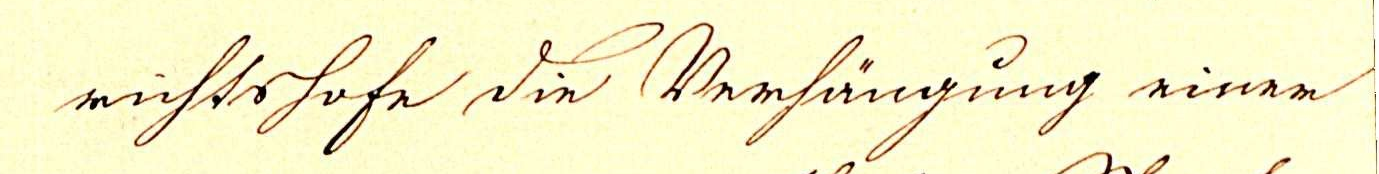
richtshofe die Verhängung einer
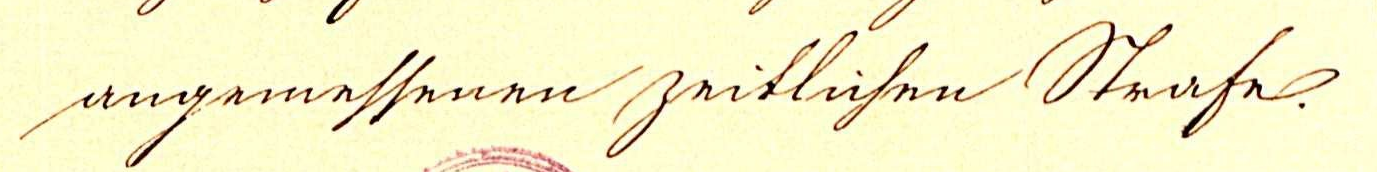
angemessenen zeitlichen Strafe.
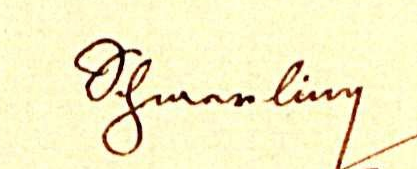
Schmerling
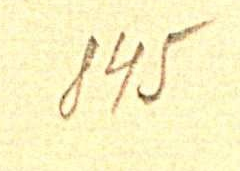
845
